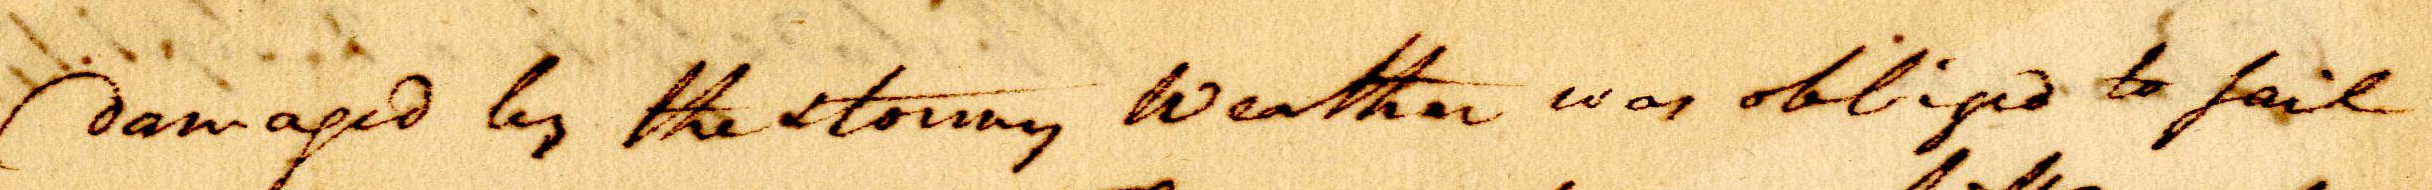damaged by the Strong Weather was obliged to sail
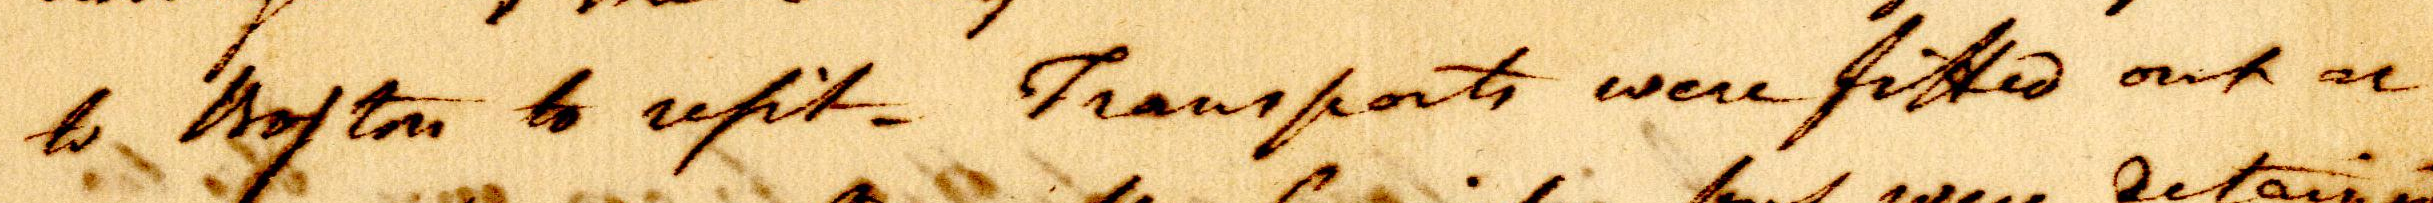to Boston to rept. Transports were fitted out at
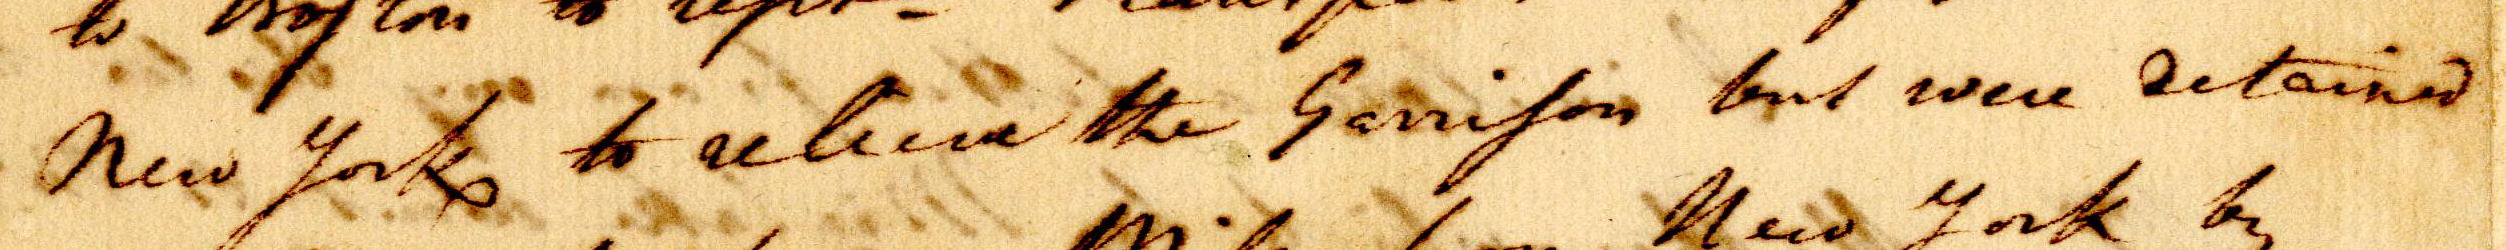New York to relieve the Garrison but were detained
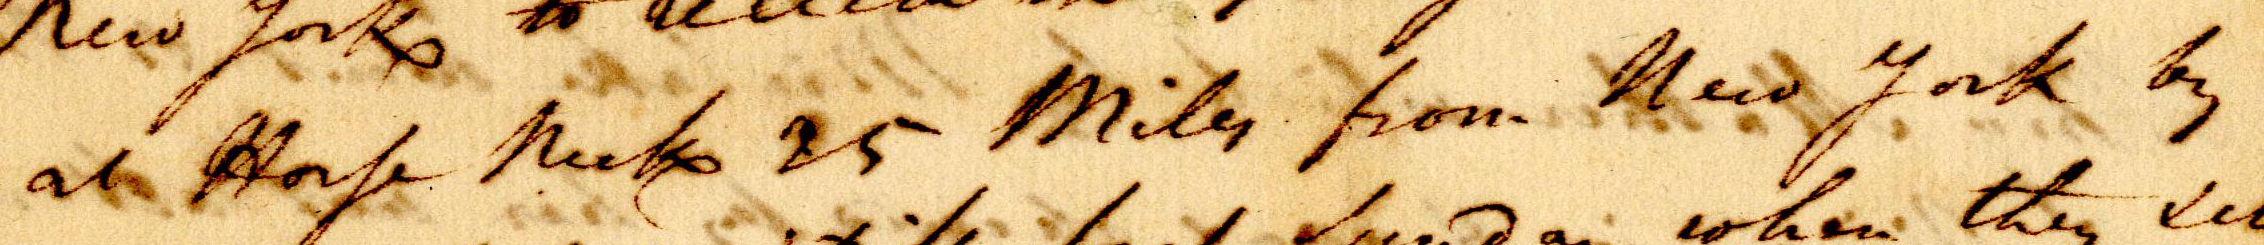at Horse Neck 25 Miles from New York by
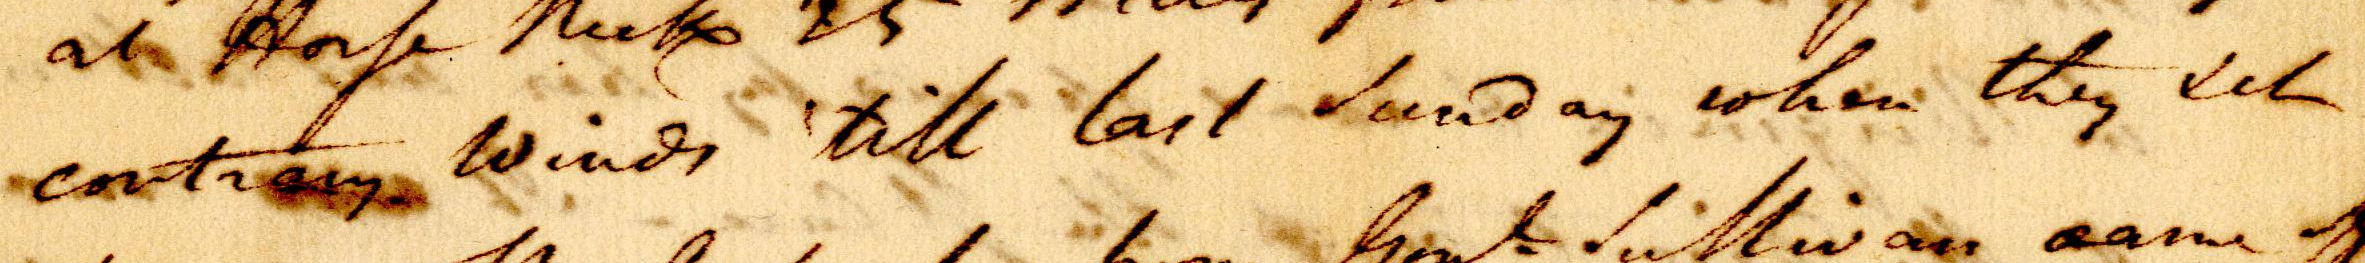contrary Winds 'till last Sunday when they set
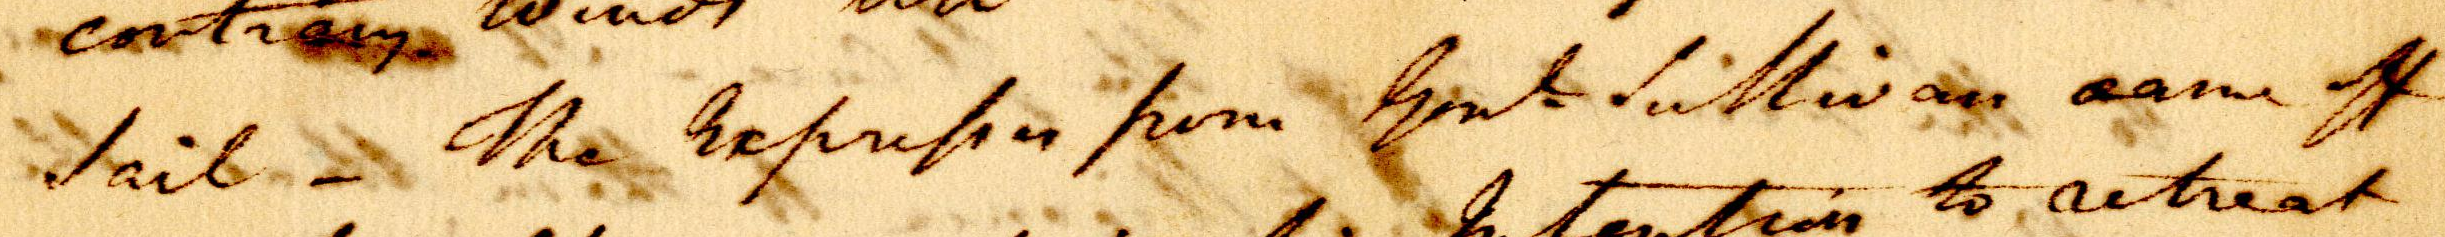sail. The Expresses from Gen^l. Sullivan came off
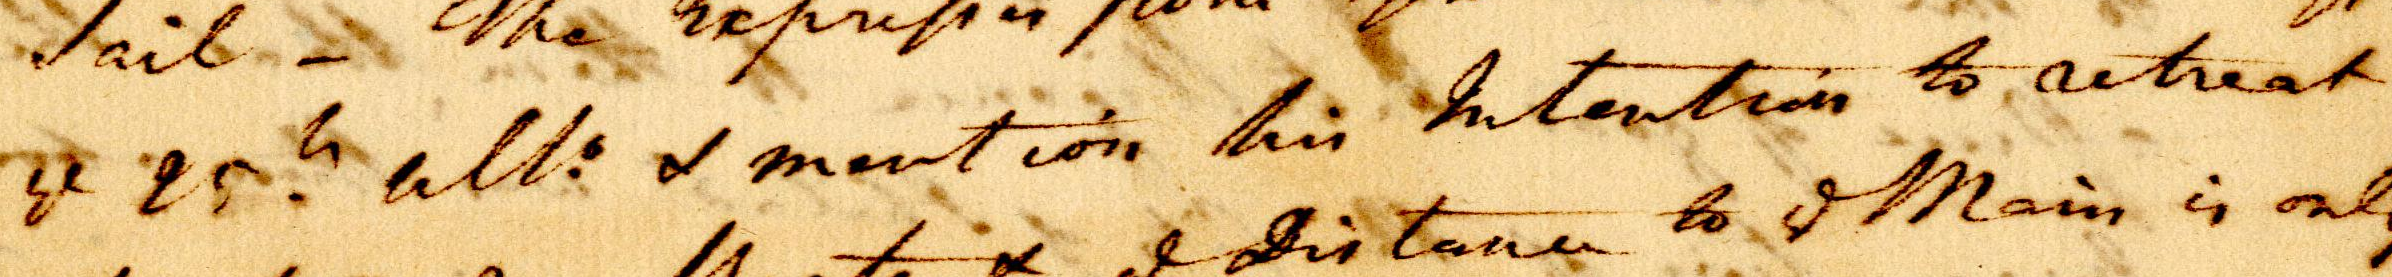ye 25^th ult^o & mention his Intention to retreat
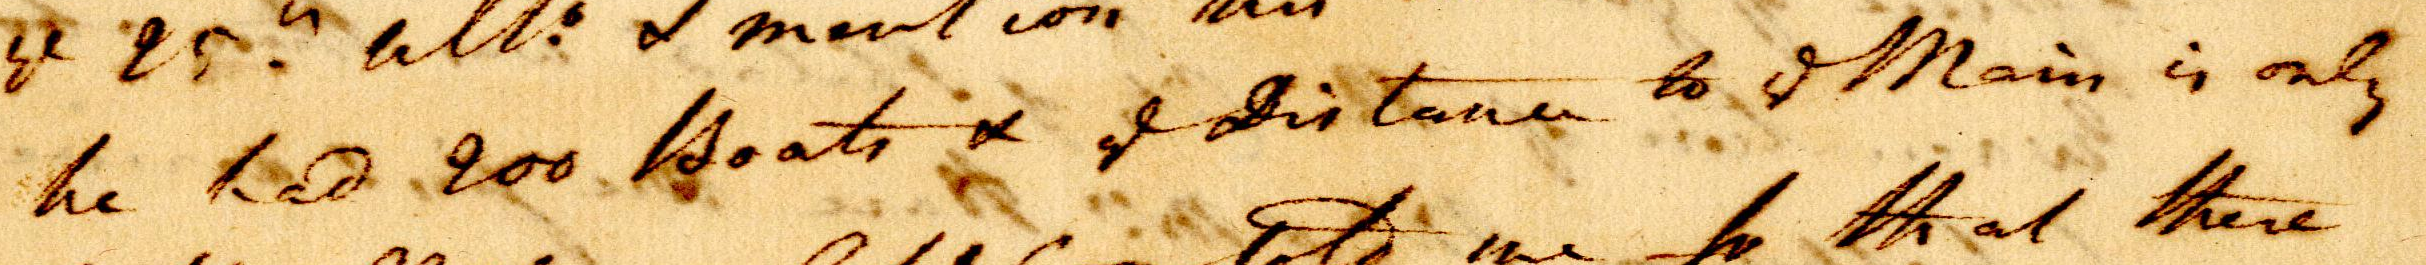he had 200 Boats & y^e Distance to Main is only
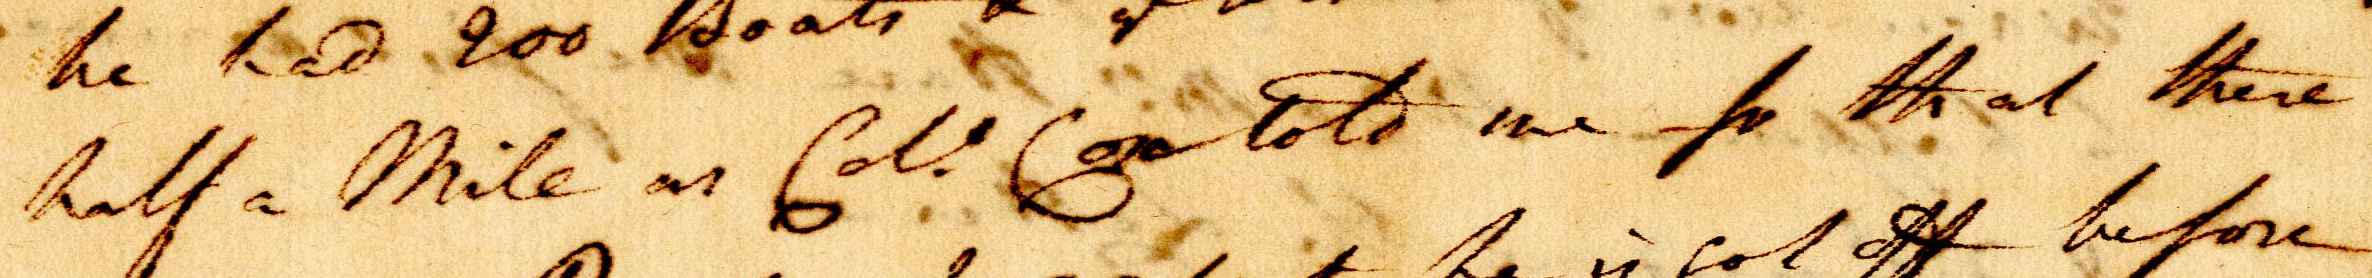half a Mile as Col^o. Com told me so that there
